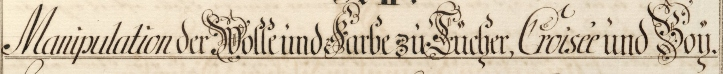Manipulation der Wolle und Farbe zu Tücher, Croisée und Boy.
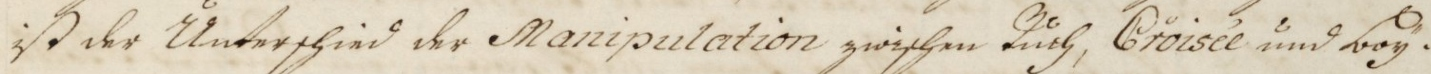ist der Unterschied der Manipulation zwischen Tuch, Croisée und Boy.
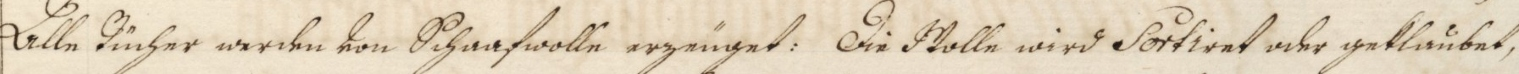Alle Tücher werden von Schaafwolle erzeüget: Die Wolle wird Sortiret oder geklaubet,
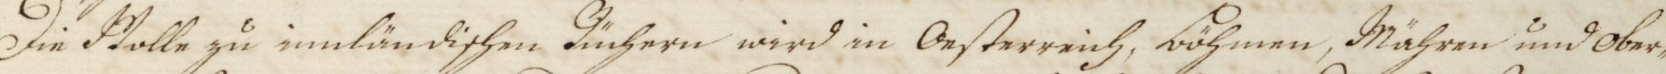Die Wolle zu innländischen Tüchern wird in Oesterreich, Böhmen, Mähren und Ober-
